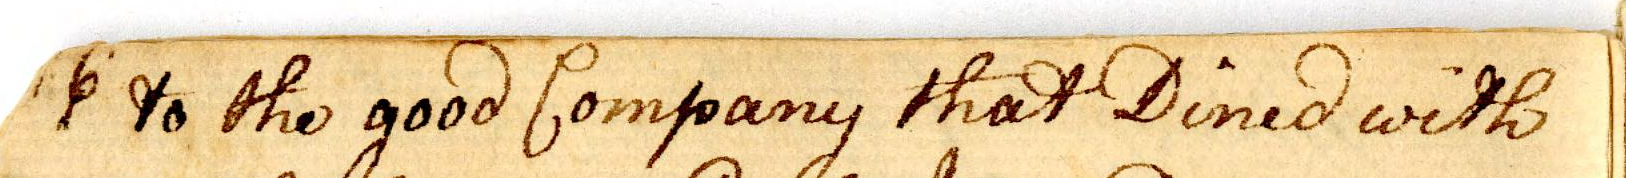16 to the good Company that Dined with
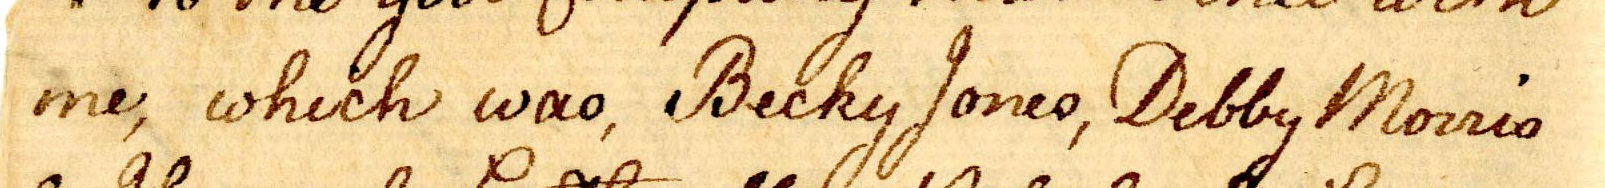me, which was, Becky Jones, Debby Morris
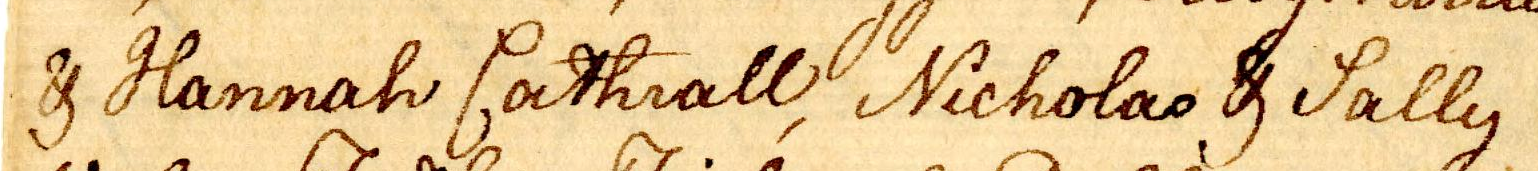& Hannah Cathrall, Nicholas & Sally
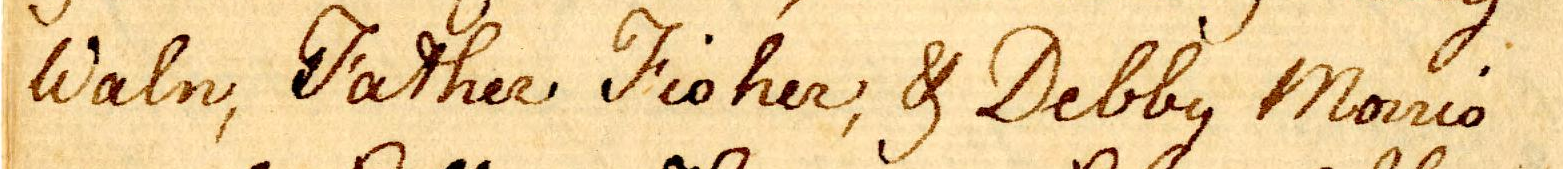Waln, Father Fisher, & Debby Morris
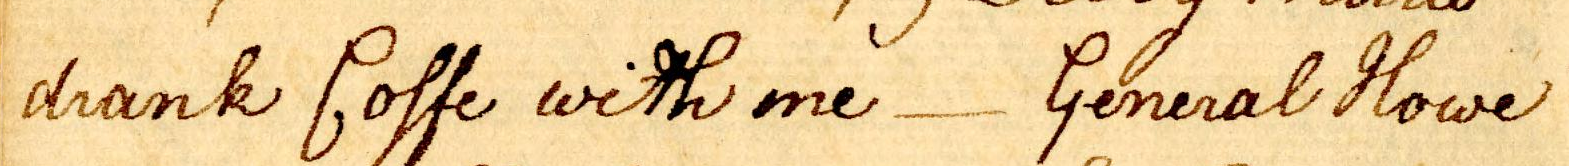drank Coffe with me- General Howe
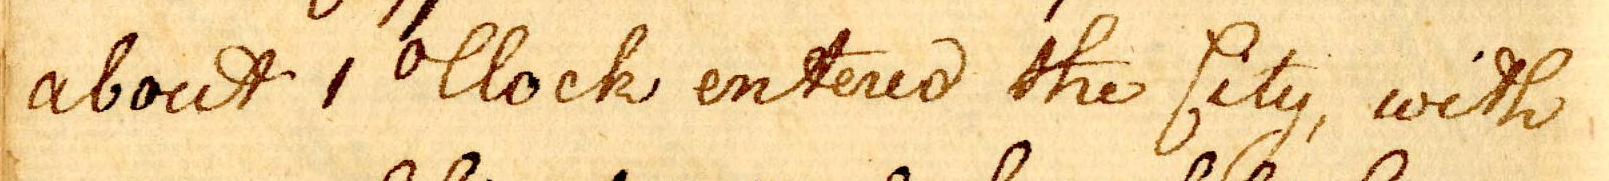about 1 ^o Clock entered the City, with
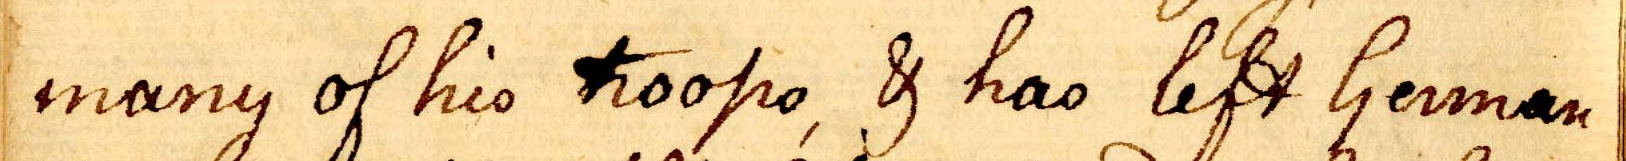many of his troops, & has left German
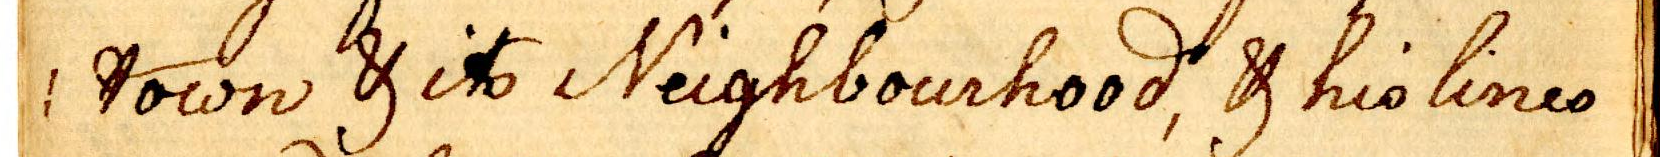-town & its Neighbourhood, & his lines
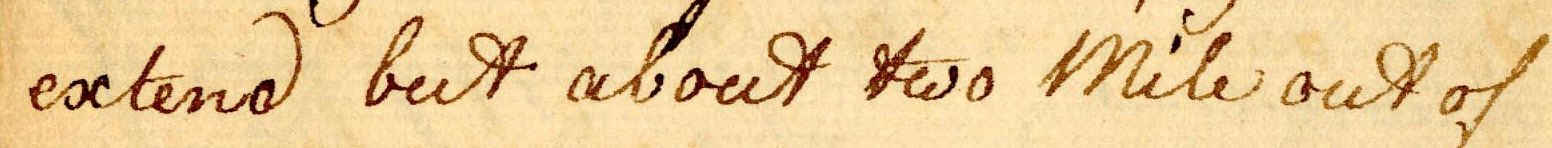extend but about two Mile out of
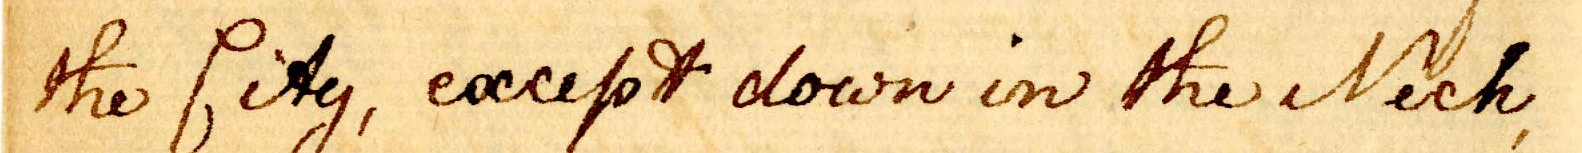the City, except down in the Nick,
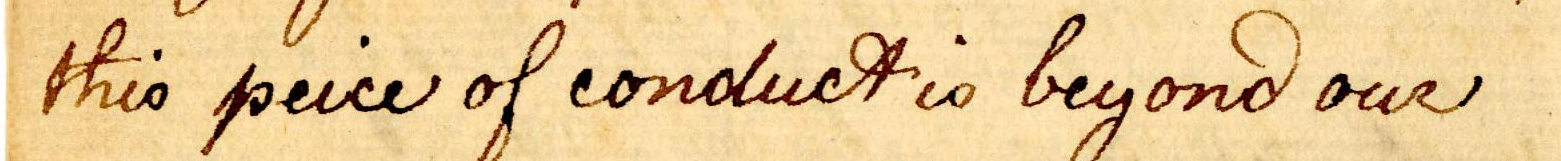this peice of conduct is beyond our
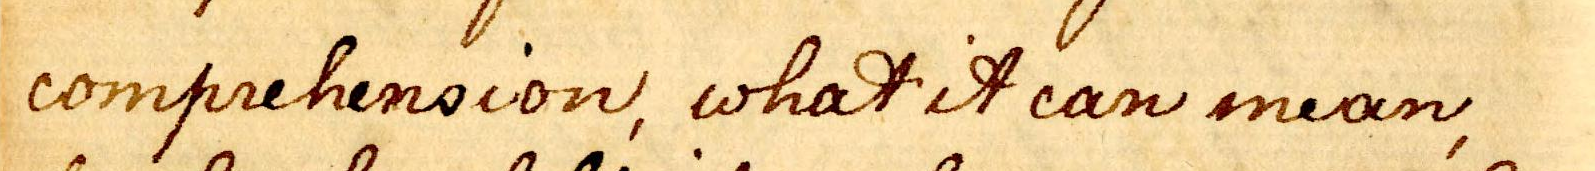comprehension, what it can mean
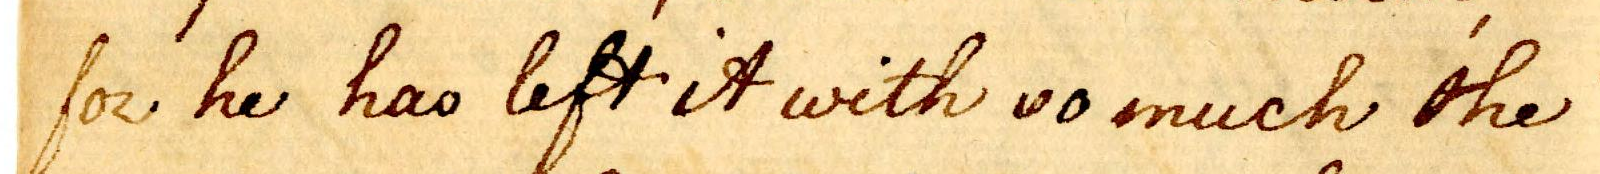for he has left it with so much the
